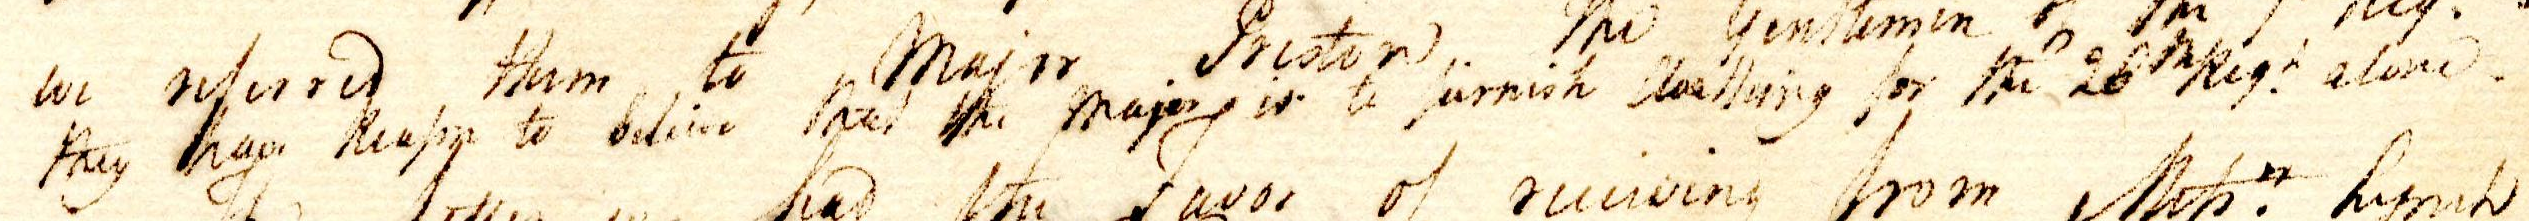they have Reason to believe that the Major is to furnish Cloathing for the 26^th. Reg^t. alone.
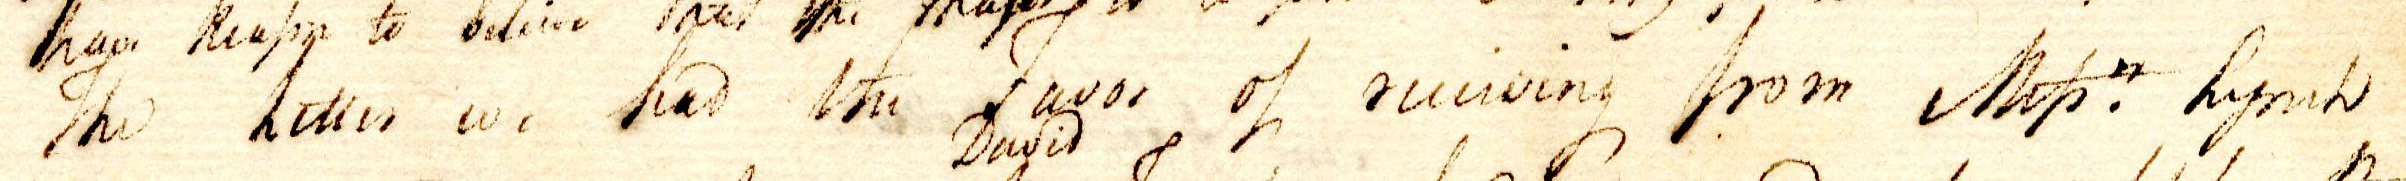The Letter we had the favor of receiving from Mess^rs. Lynch
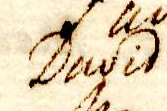David
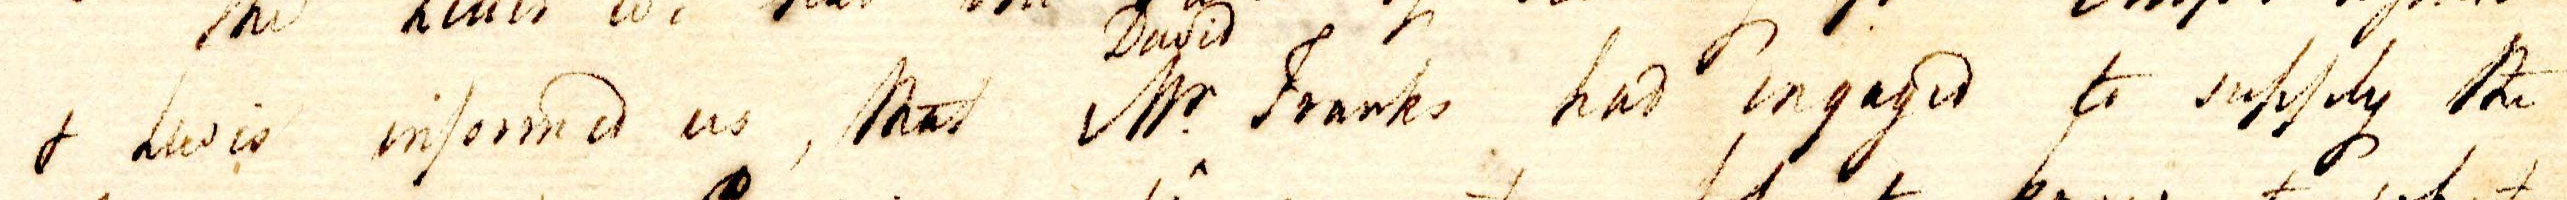& Davis informed us, that M^r. ^ Frarks had engaged to supply the
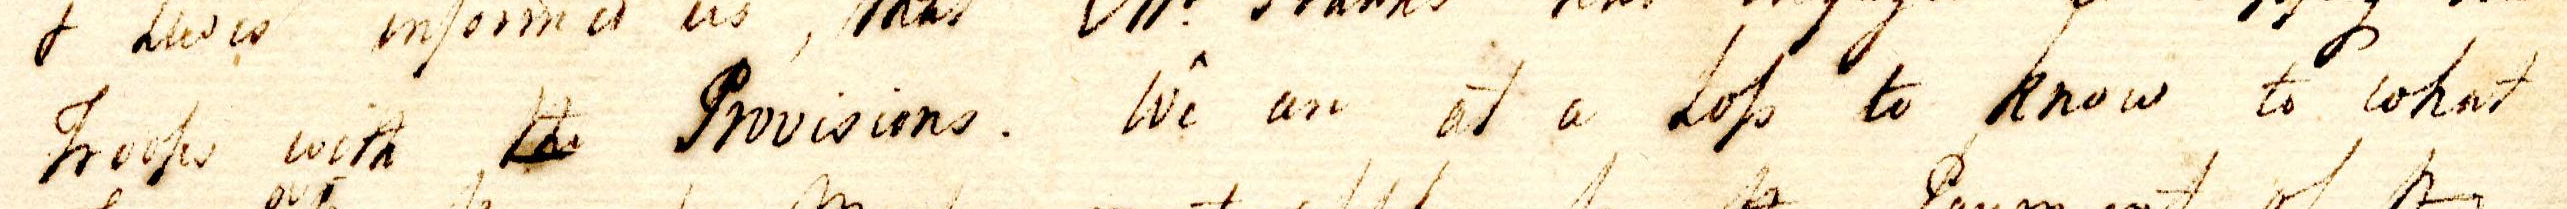Troops with the Provisions. We are at a Loss to know to what
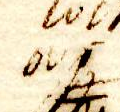our
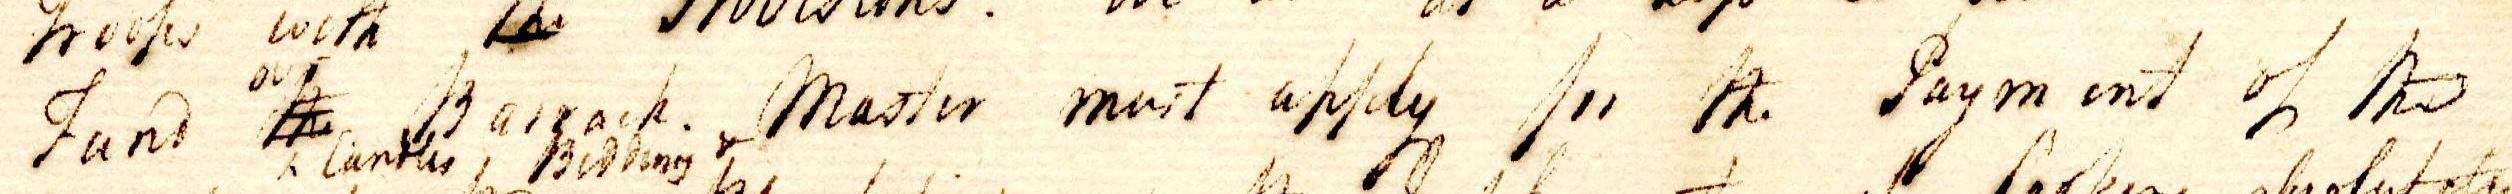Fund the ^ Barrack Master must apply for the Payment of the
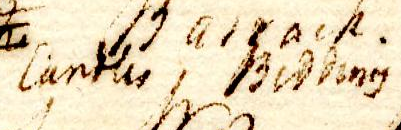Candles Bedding
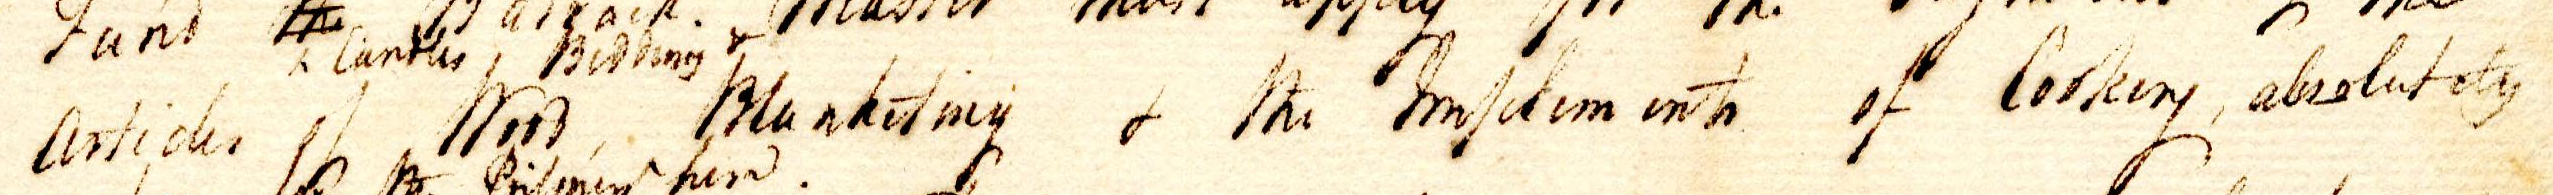Articles of Wood, ^ Blanketing & the Implements of Corkery, absolutely
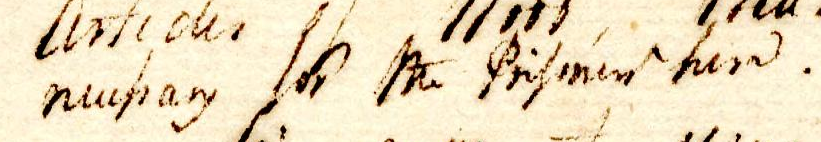necessary for the Prisoner here.
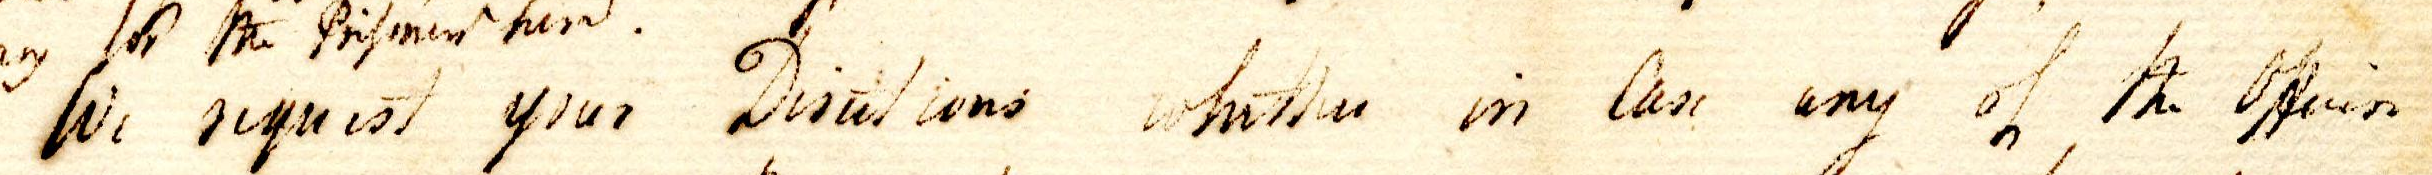We request your Directions whether in Case any of the Officers
